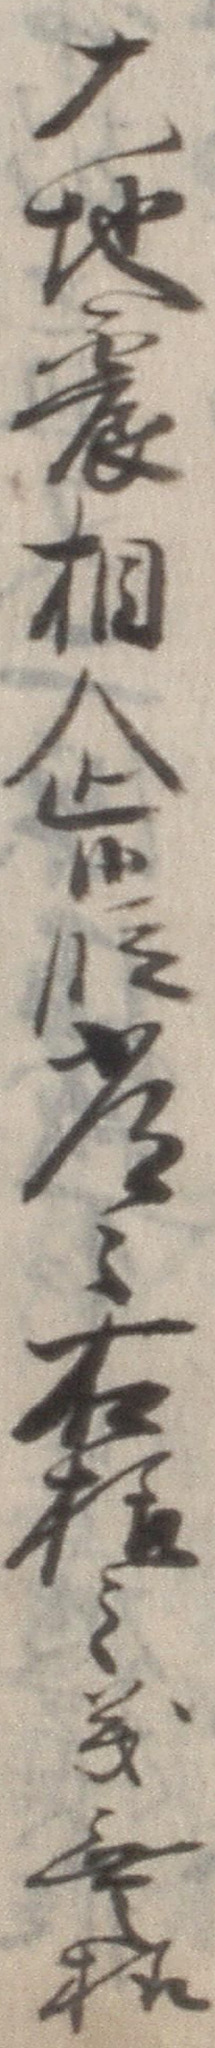大地震相企候段常ゝ右様之義無様
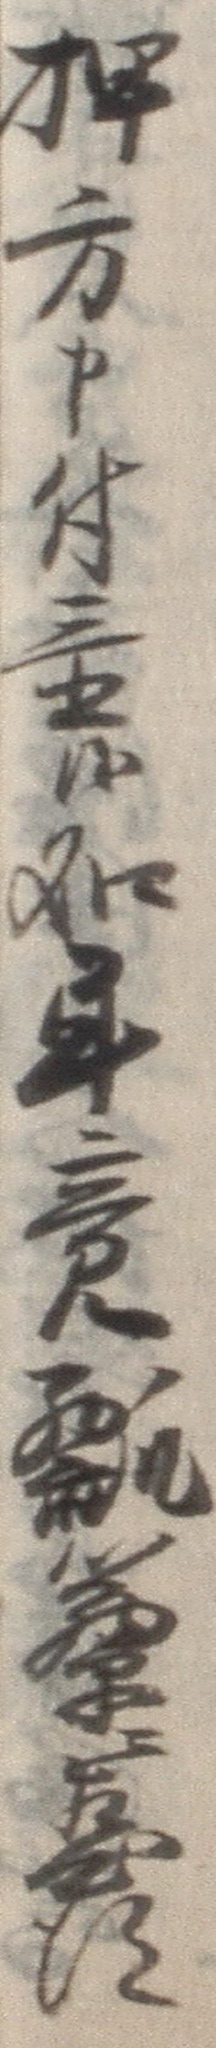押方申付置候処畢竟瓢箪に相心得
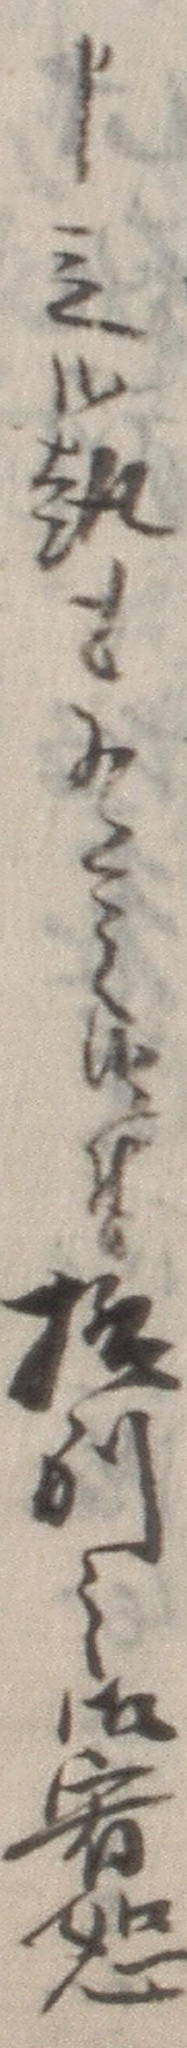申立候趣もみこみ候二付格別之御宥恕
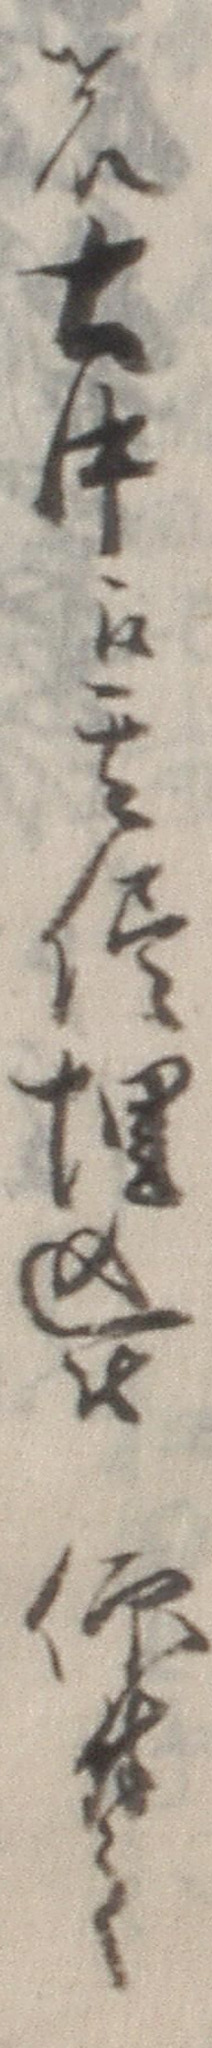を以土中江其儘埋込被仰付候
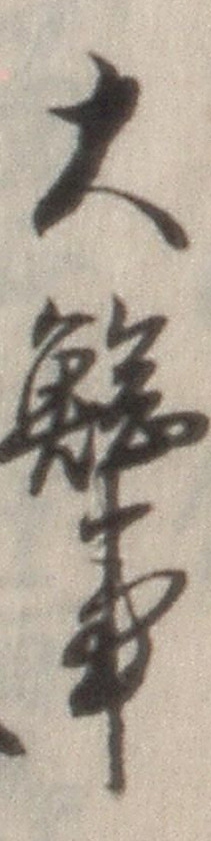大鯰事
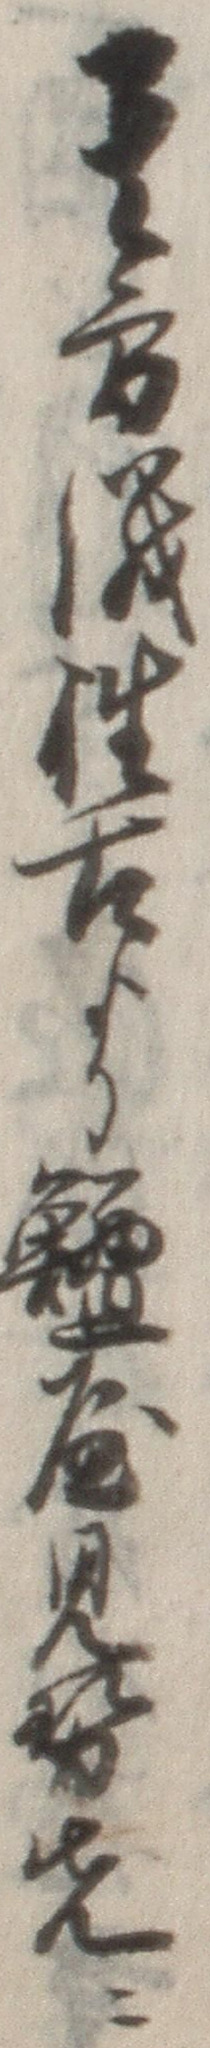其方儀往古より鰻？屋見せ先二
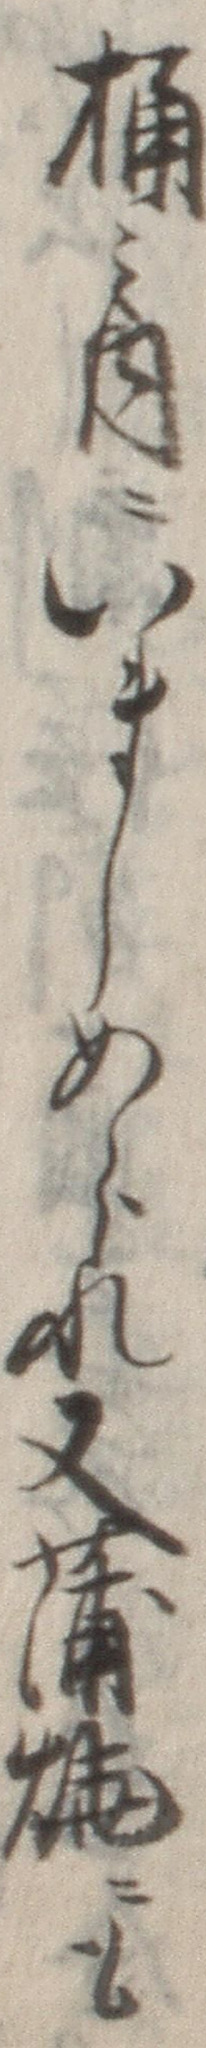桶之内二いましめられ又蒲焼二も
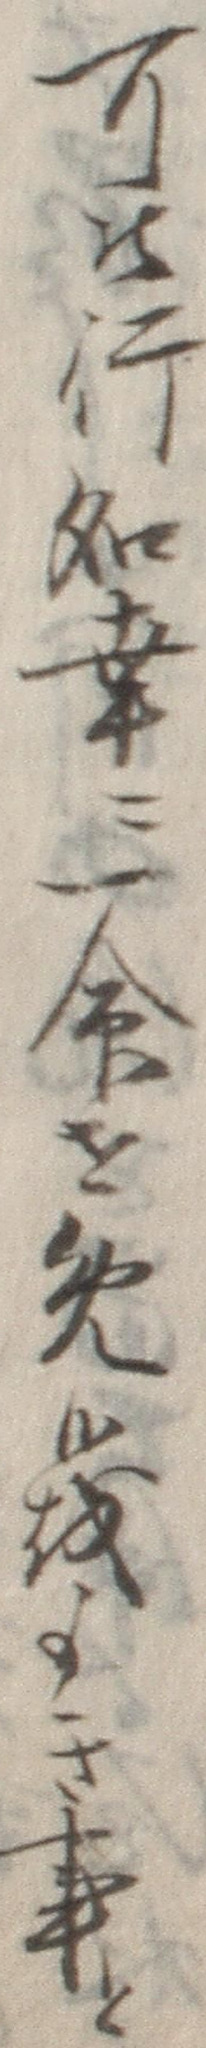可被行処幸二一命を免候をよき事と
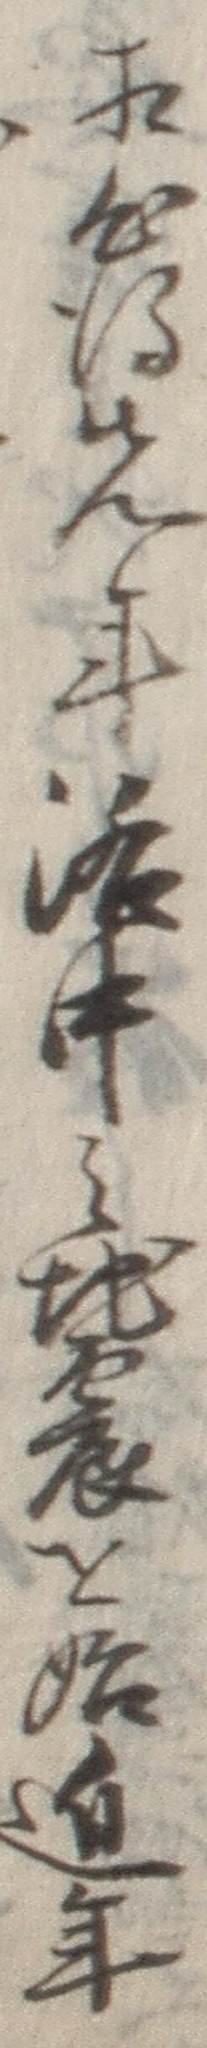相心得先年洛中之地震を始近年
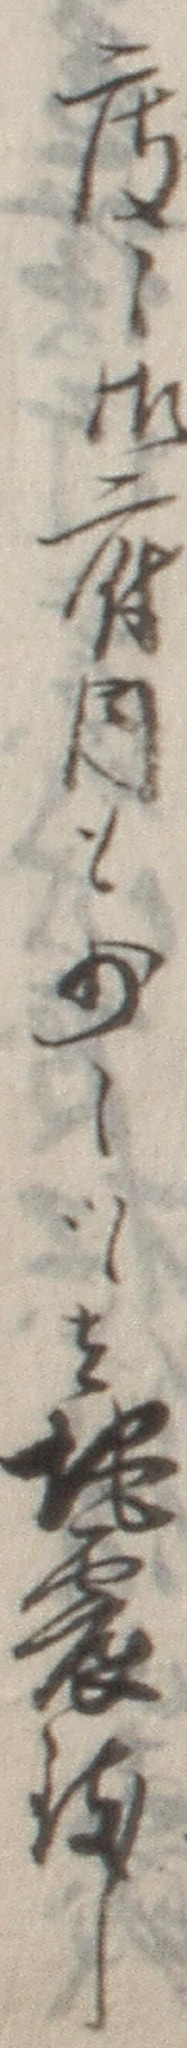度々御府内も少しツゝは地震致し

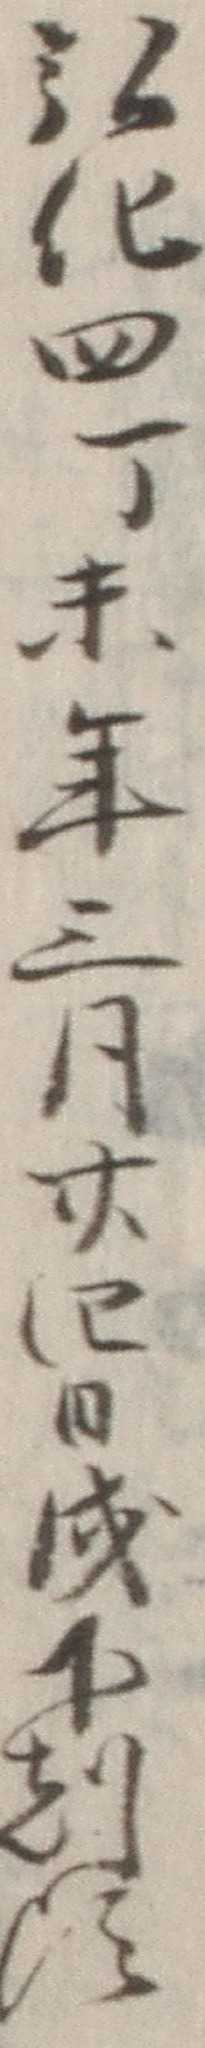弘化四丁未年三月廿四日戌下刻頃
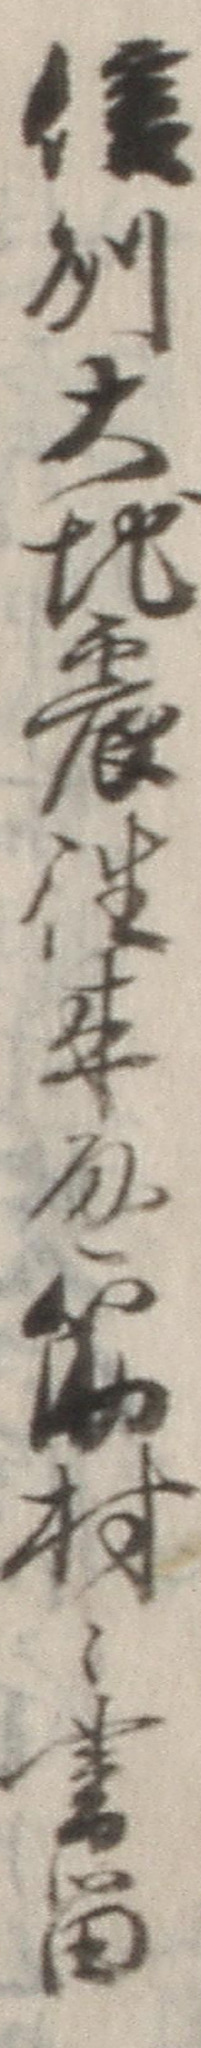信州大地震往来通筋村々書留
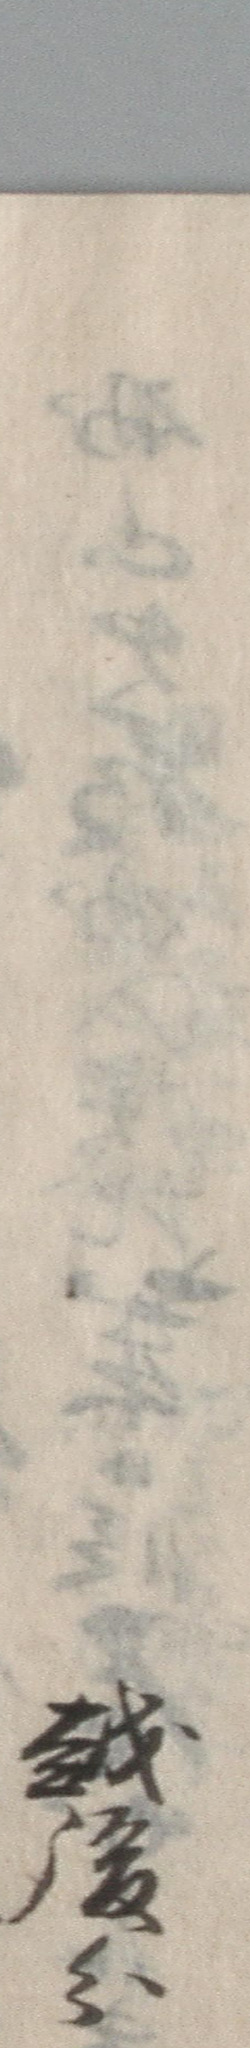越後分
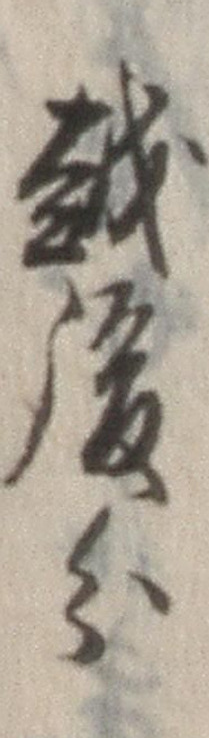越後分
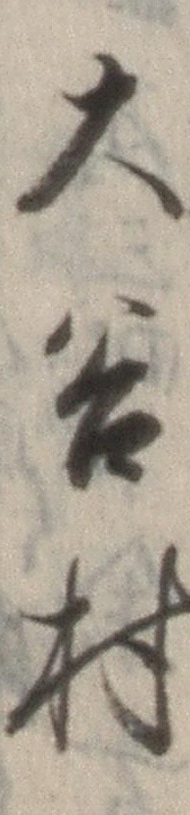大谷村
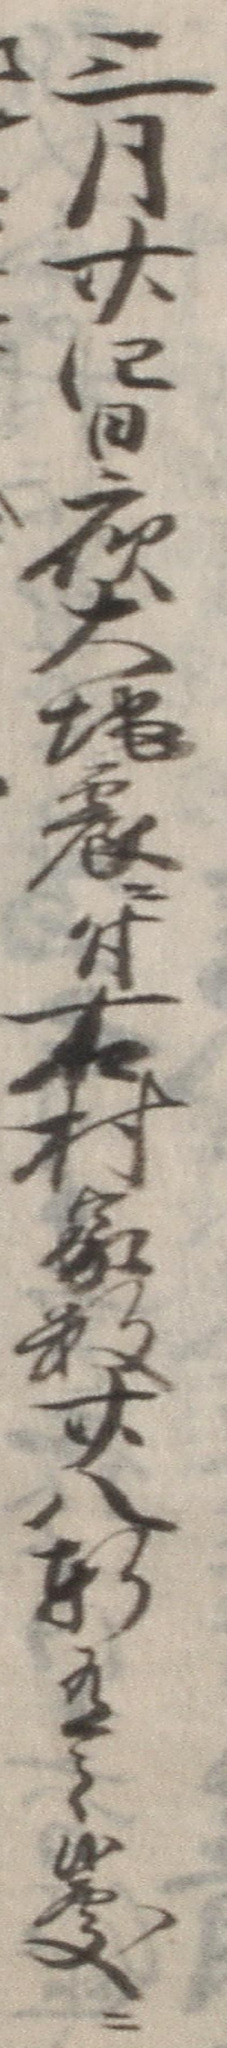三月廿四日夜大地震ニ付右村家数廿八軒有之候處ニ
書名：[善光寺地震に関する冊子]
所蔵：東京大学地震研究所図書室 Earthquake Research Institute Library, The University of Tokyo, JAPAN
